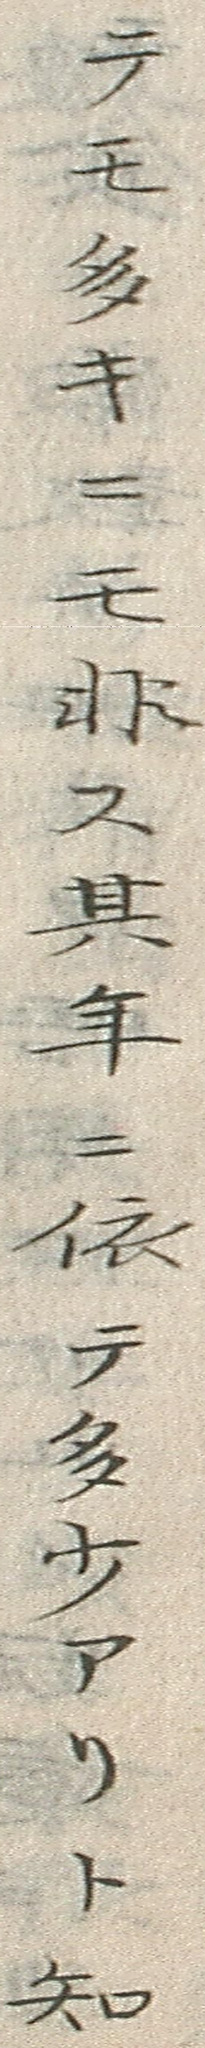テモ多キニモ非ス其年ニ依テ多少アリト知
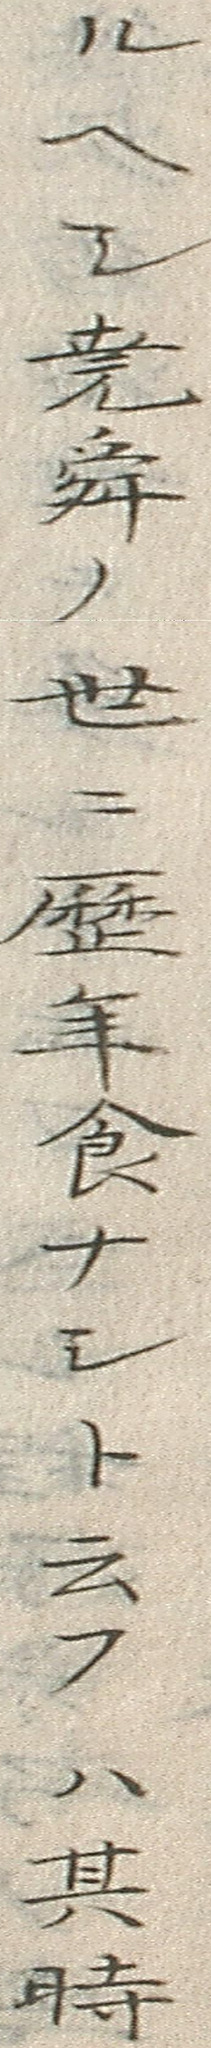ルヘシ尭舜ノ世ニ歴年食ナシト云フハ其時
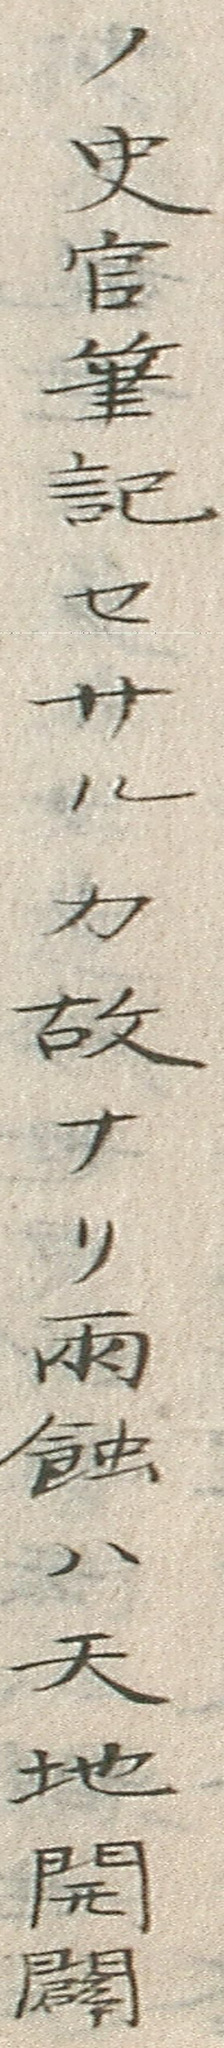ノ史官筆記セサルカ故ナリ両蝕ハ天地開闢
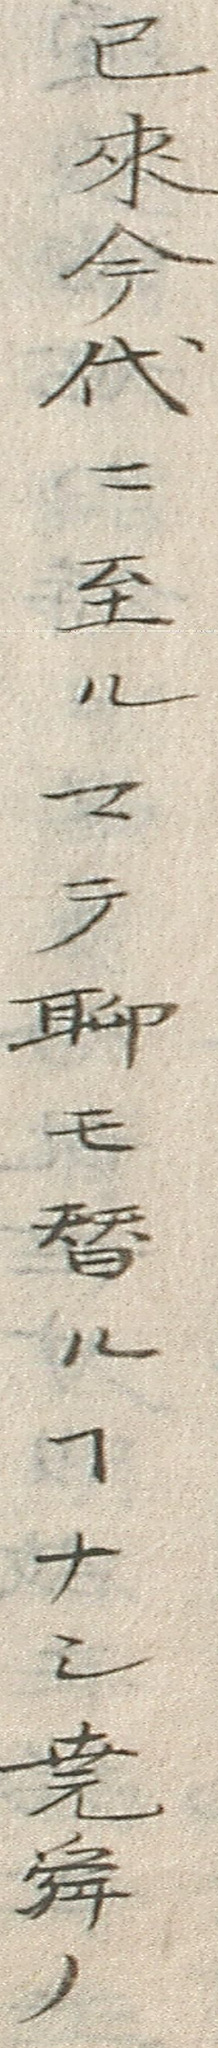已来今代ニ至ルマテ聊モ替ルコトナシ尭舜ノ
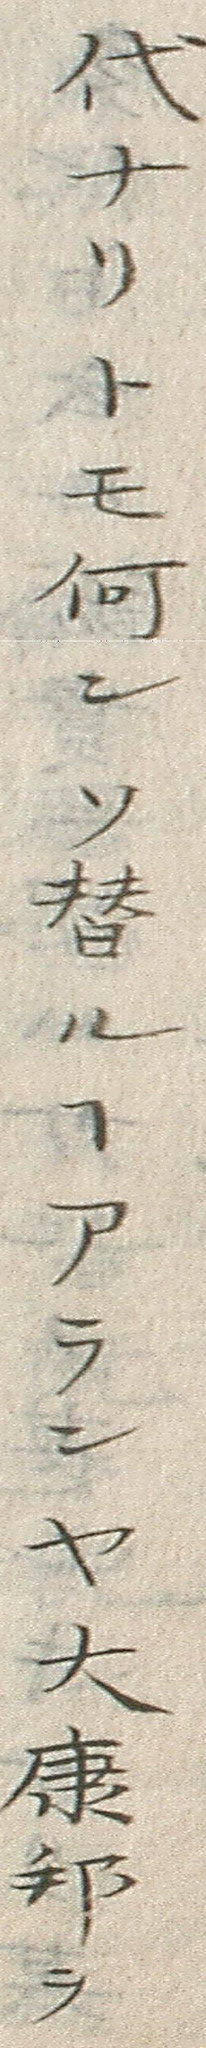代ナリトモ何ンソ替ルコトアランヤ大康邦ヲ
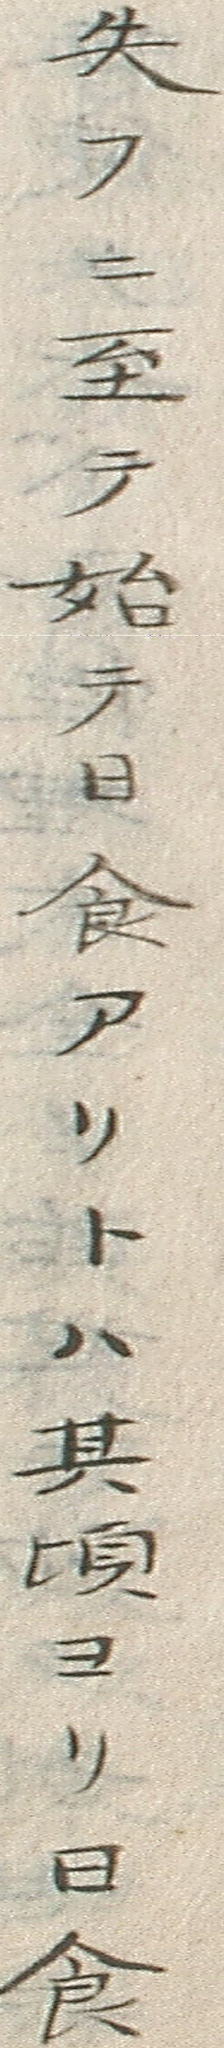失フニ至テ始テ日食アリトハ其頃ヨリ日食
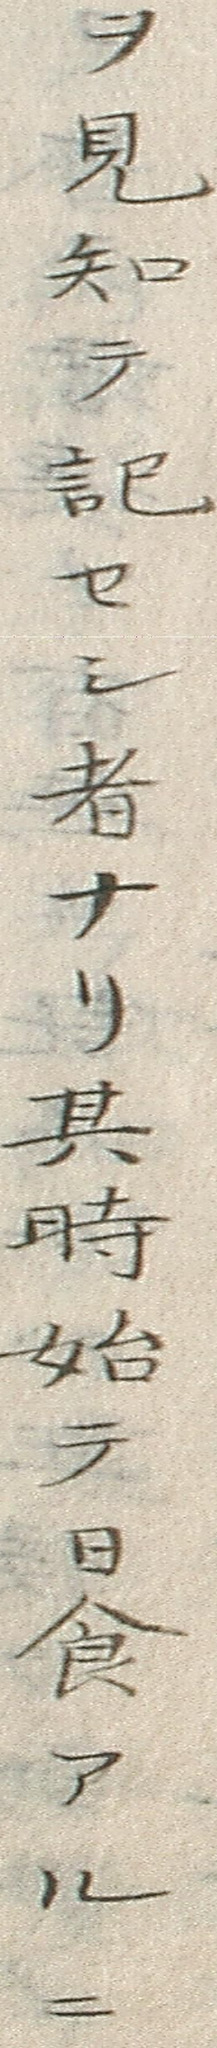ヲ見知テ記セシ者ナリ其時始テ日食アルニ
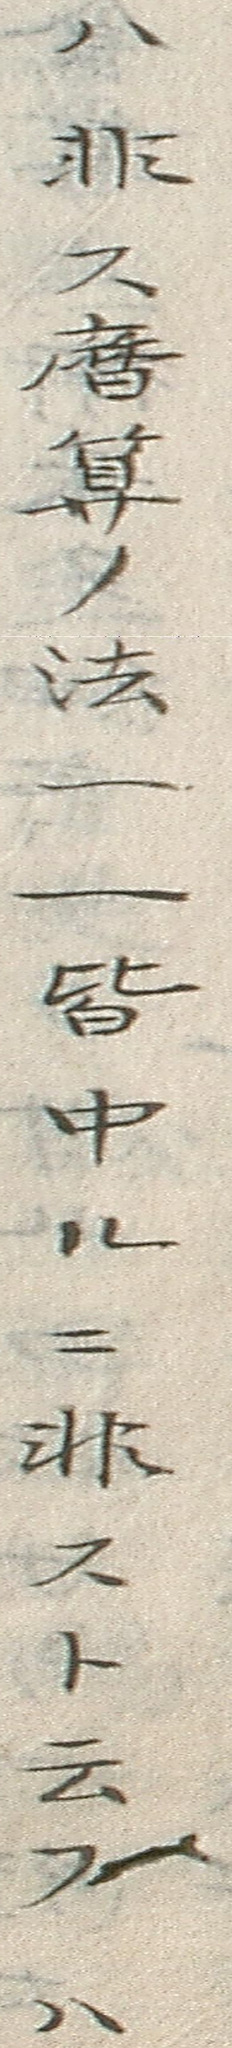ハ非ス暦算ノ法一一皆中ルニ非スト云フハ

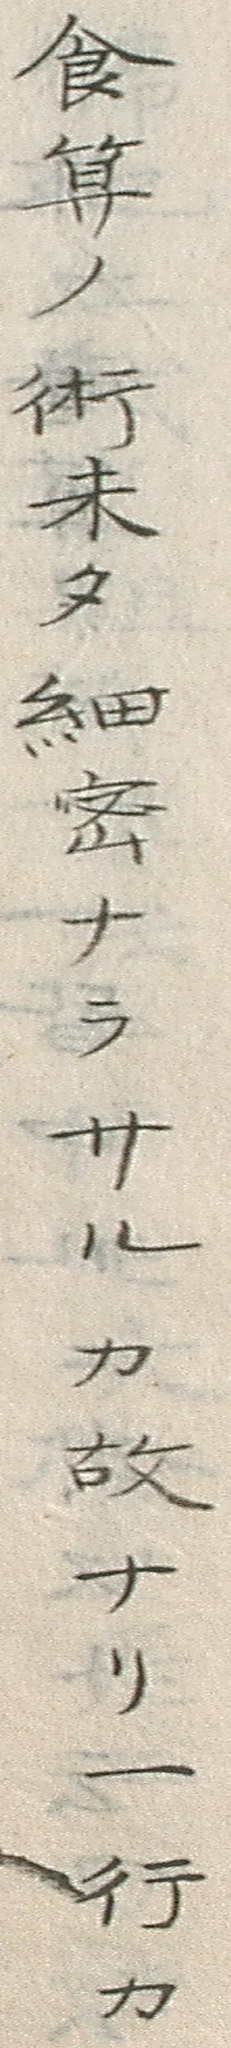食算ノ術未タ細密ナラサルカ故ナリ一行カ
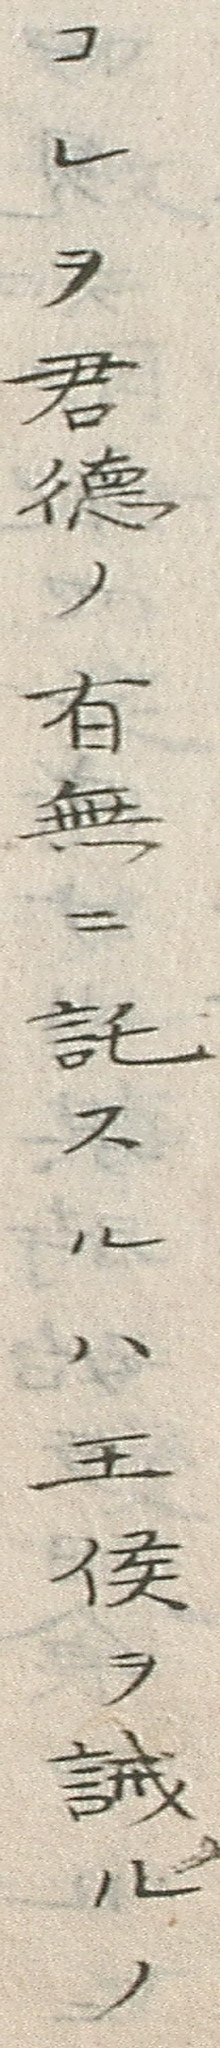コレヲ君徳ノ有無ニ託スルハ王侯ヲ誡ルノ
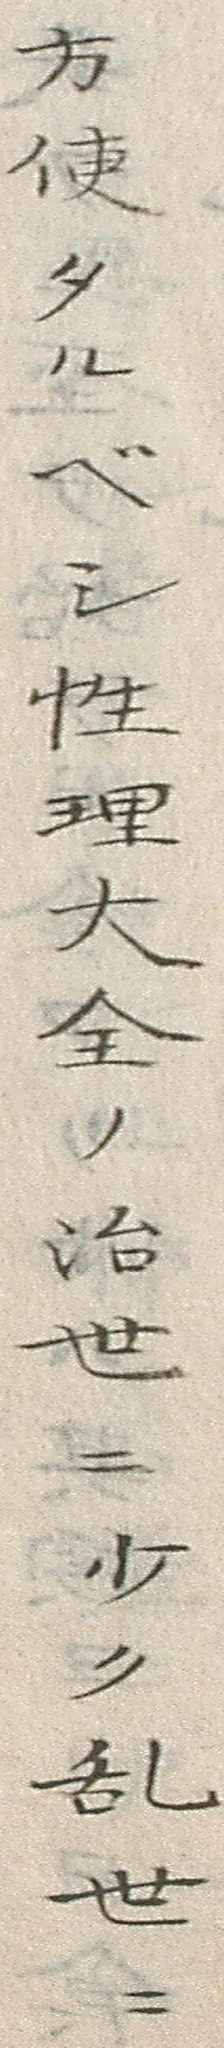方便タルベシ性理大全ノ治世ニ少ク乱世ニ
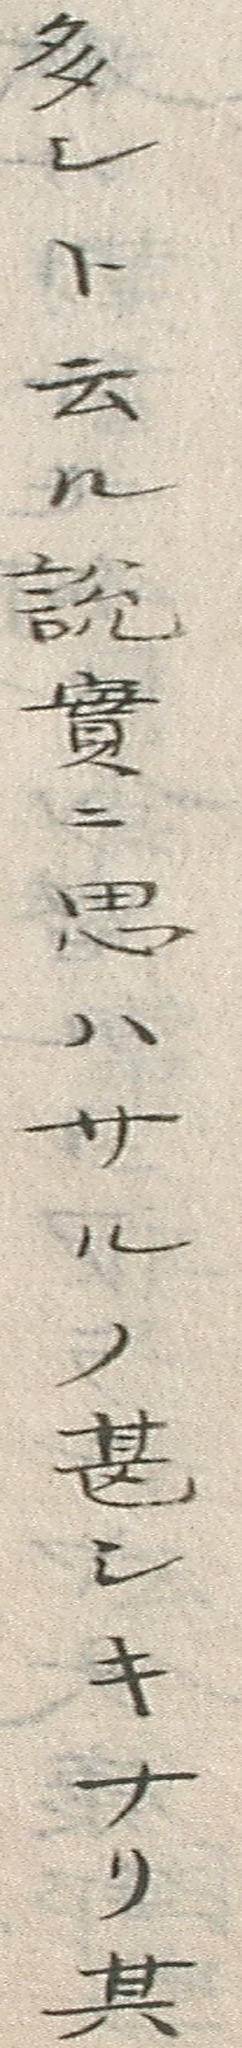多シト云ル説実ニ思ハサルノ甚シキナリ其
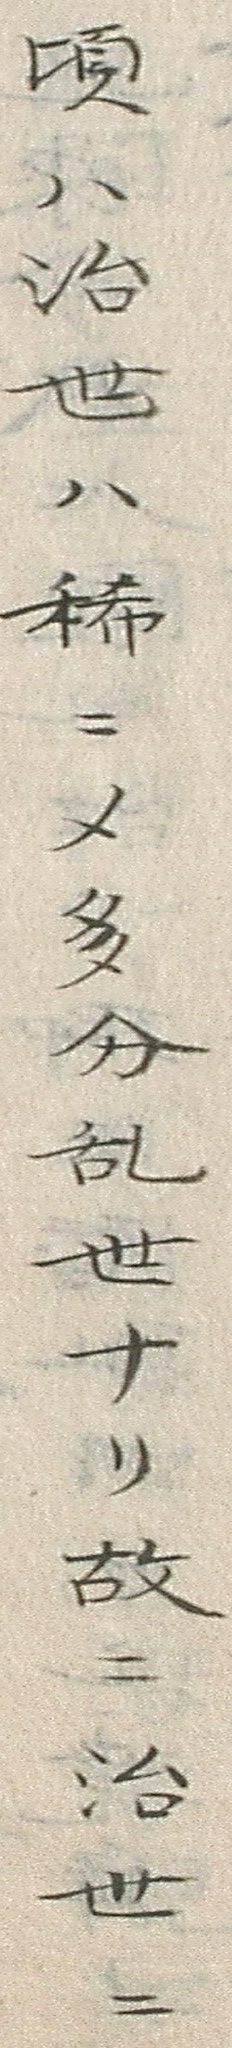頃ハ治世ハ稀ニシテ多分乱世ナリ故ニ治世ニ
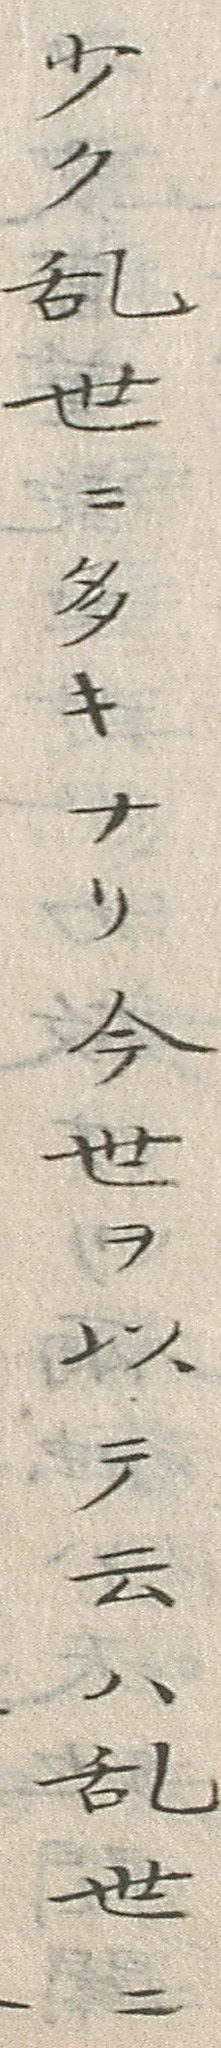少ク乱世ニ多キナリ今世ヲ以テ云ハ乱世ニ
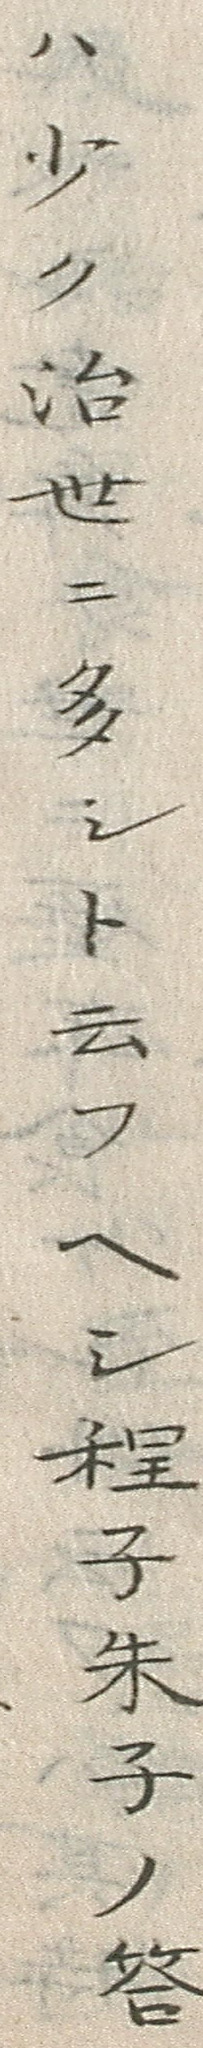ハ少ク治世ニ多シト云フヘシ程子朱子ノ答
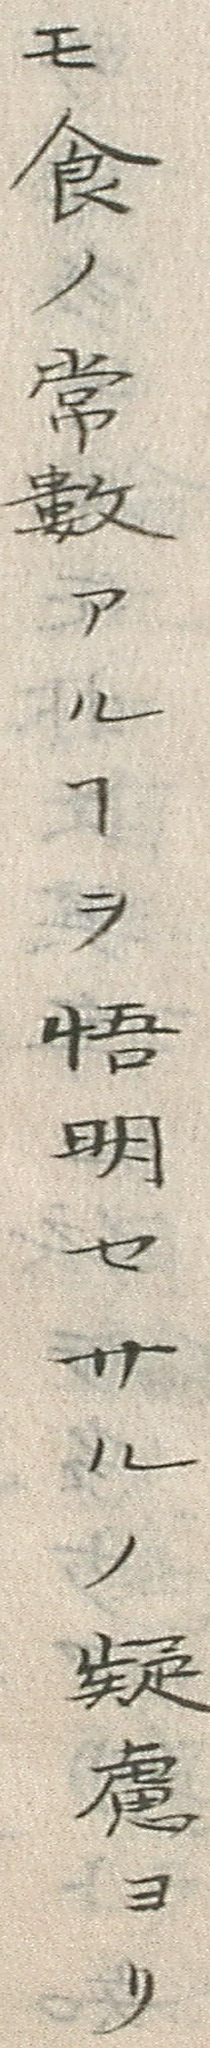モ食ノ常数アルコトヲ悟明セサルノ疑慮ヨリ
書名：天學略名目羽翼　全
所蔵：東京大学地震研究所図書室 Earthquake Research Institute Library, The University of Tokyo, JAPAN
